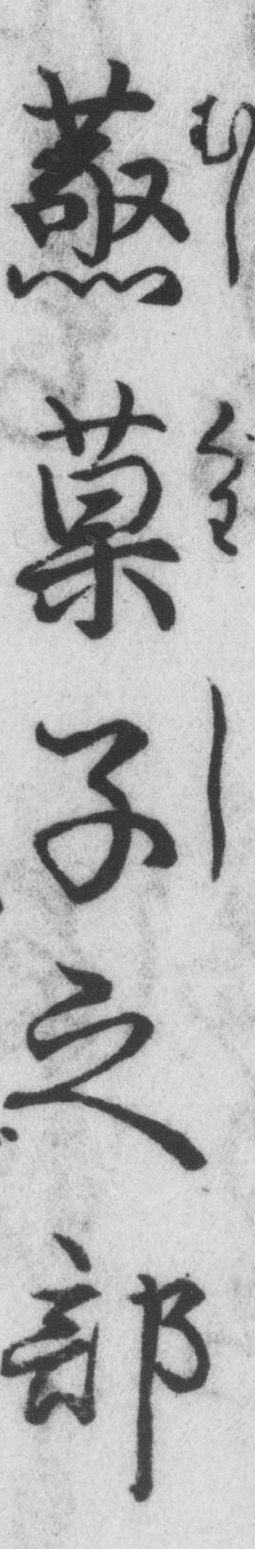蒸菓子之部

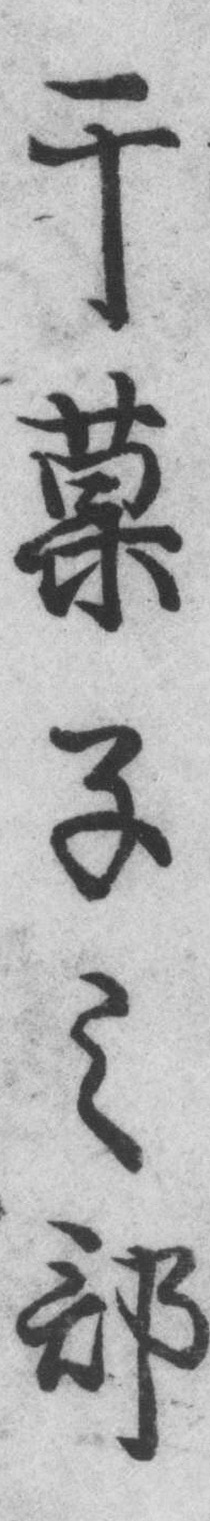干菓子之部

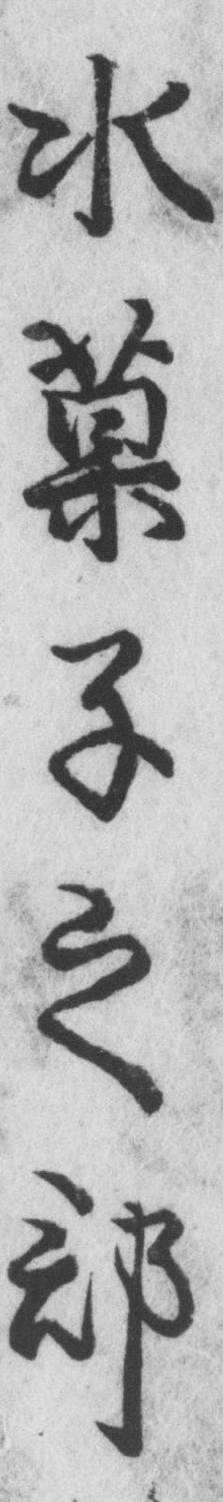水菓子之部

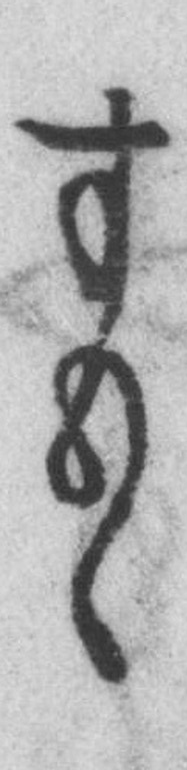すもゝ
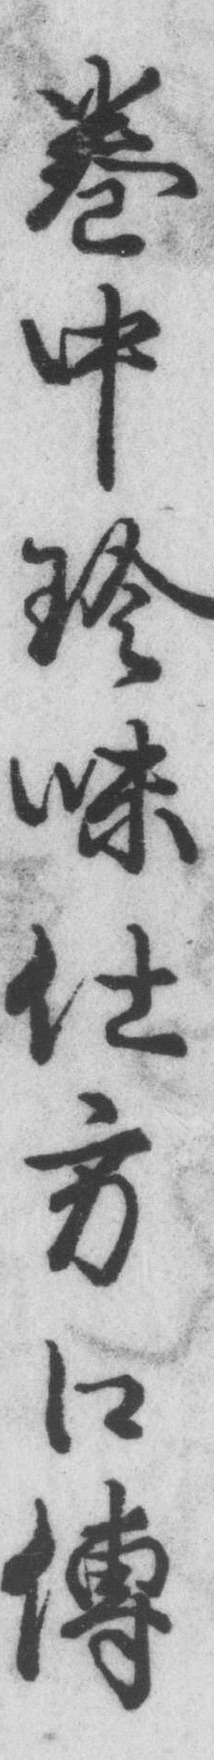巻中珍味仕方口傳
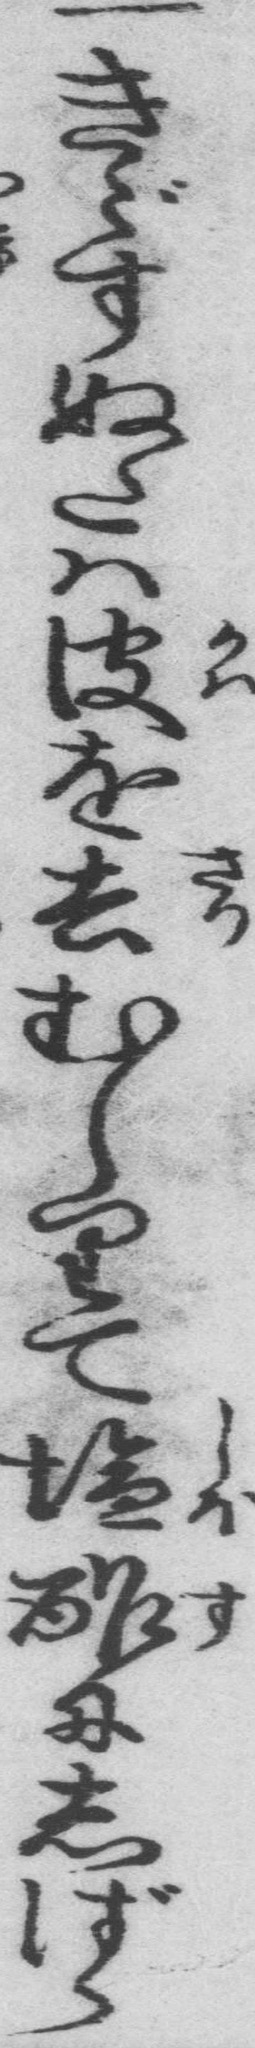一きゞすぬたは皮を去むし里て塩酢丹志ばら
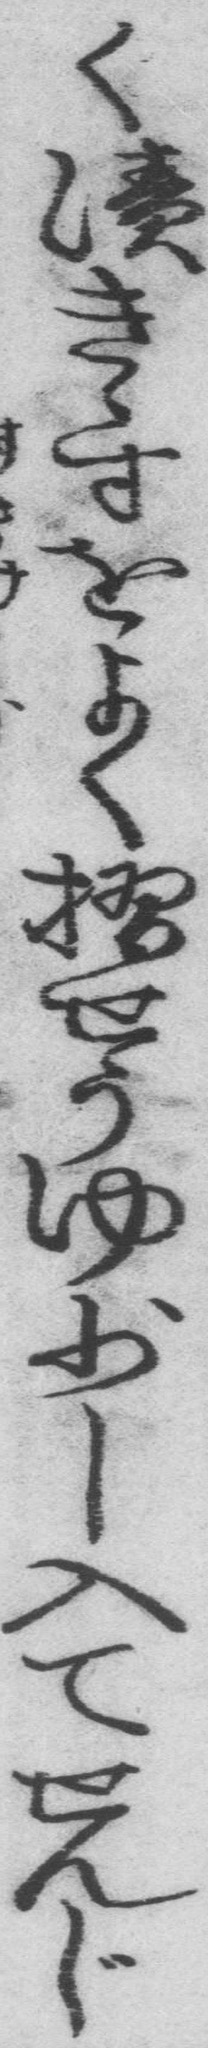く漬きゝすをよく摺せうゆ少し入てせんじ
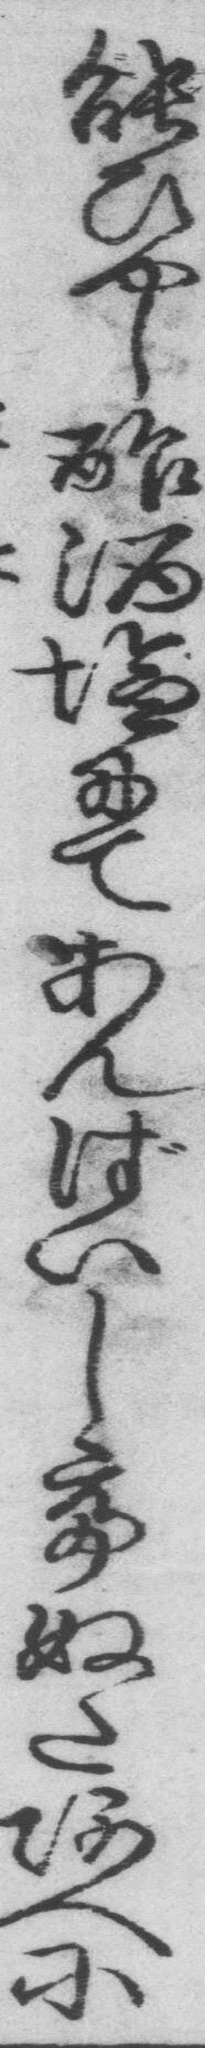能ひやし酢酒塩丹てあんばいし亭ぬた阿へ尓
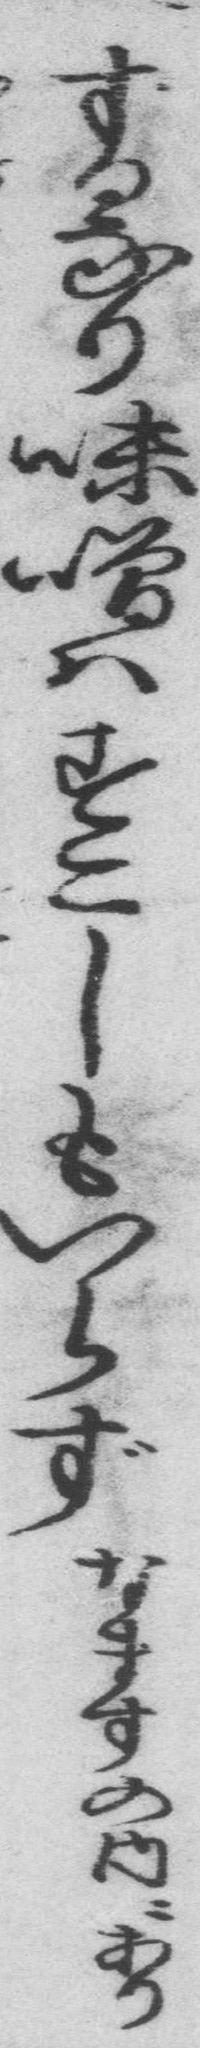するなり味噌は春こしもいらずなますの内にあり
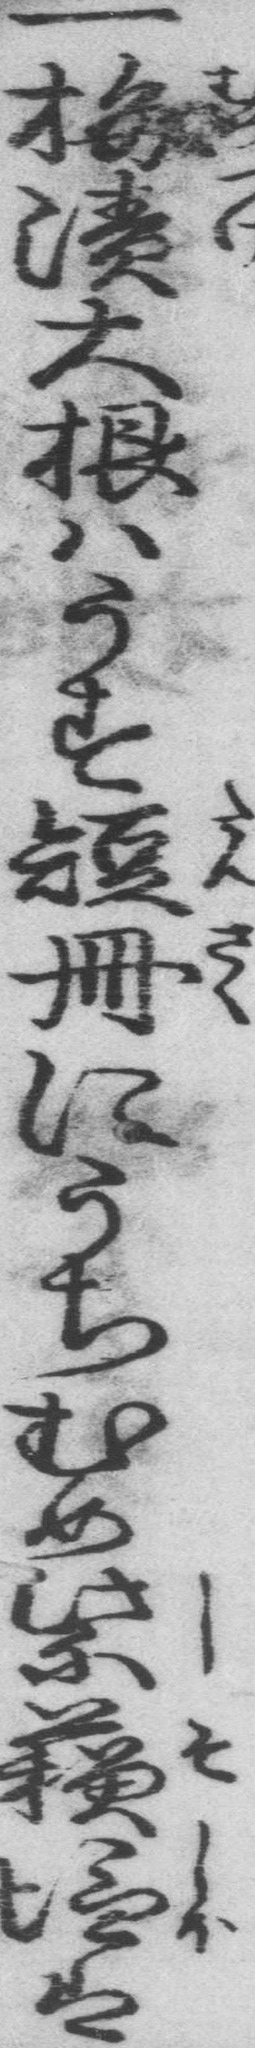一梅漬大根はう春短冊にうちむめ紫蘇塩盤
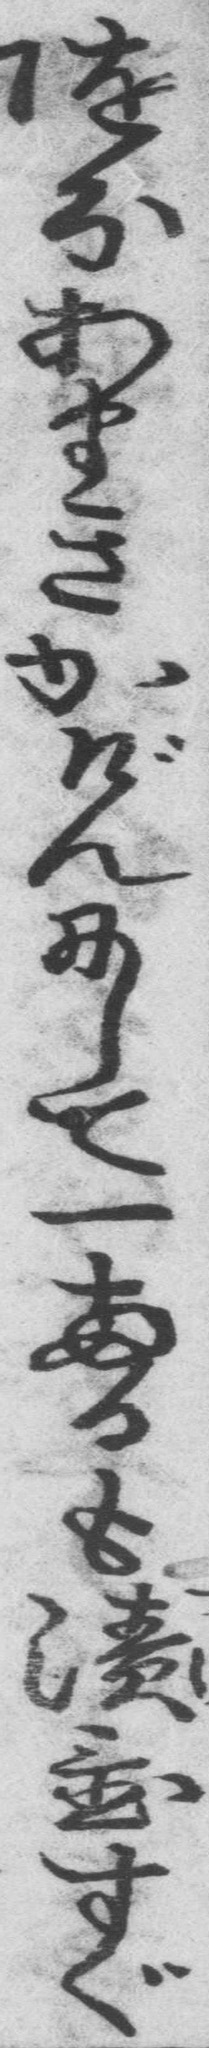随分あまきかげん丹して一両日も漬置すぐ
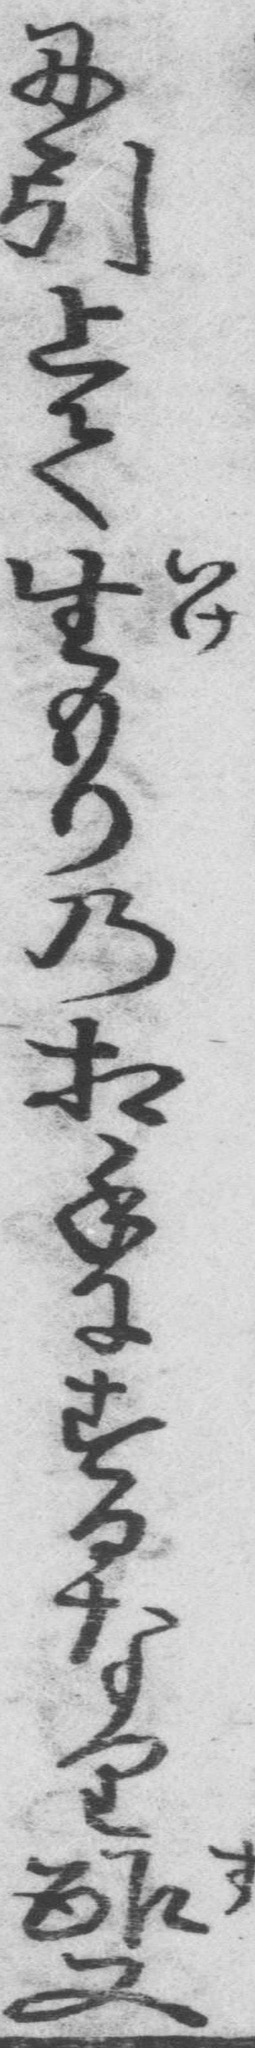丹引上て生もり乃相手尓春るなり里酢又
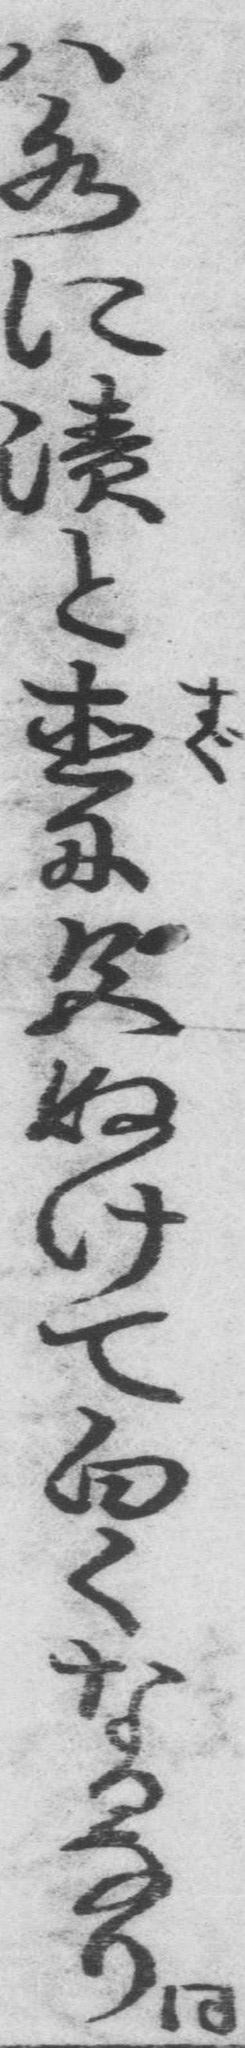は水に漬と直丹色ぬけて白くなるなり同
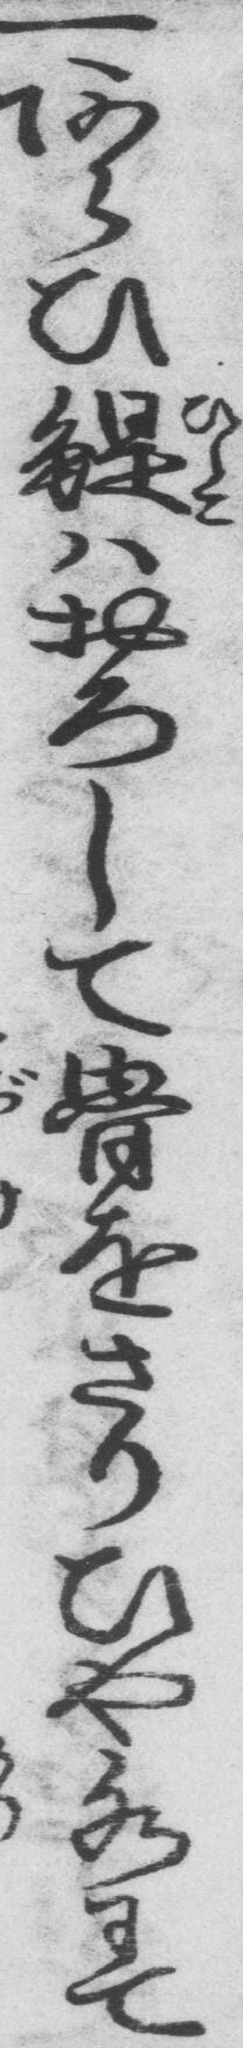一阿らひ鯷はおろして骨をさりひや水尓て
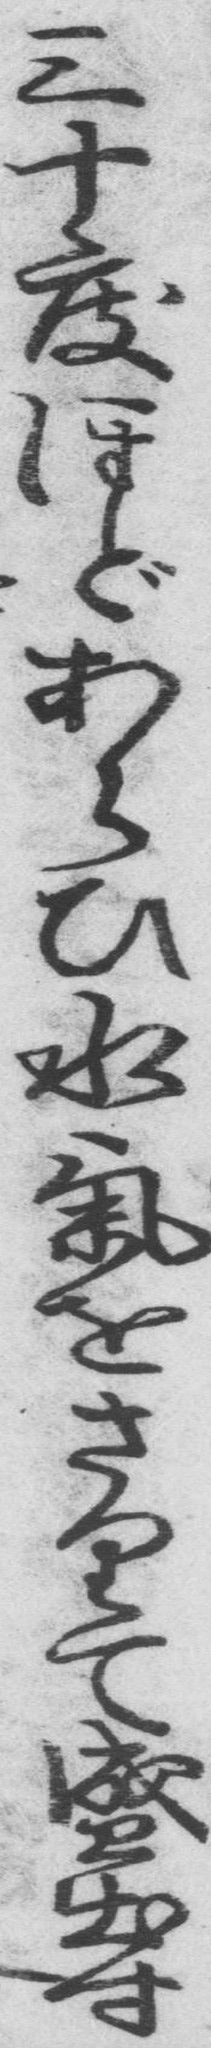三十度ほどあらひ水気をさ里て盛出す
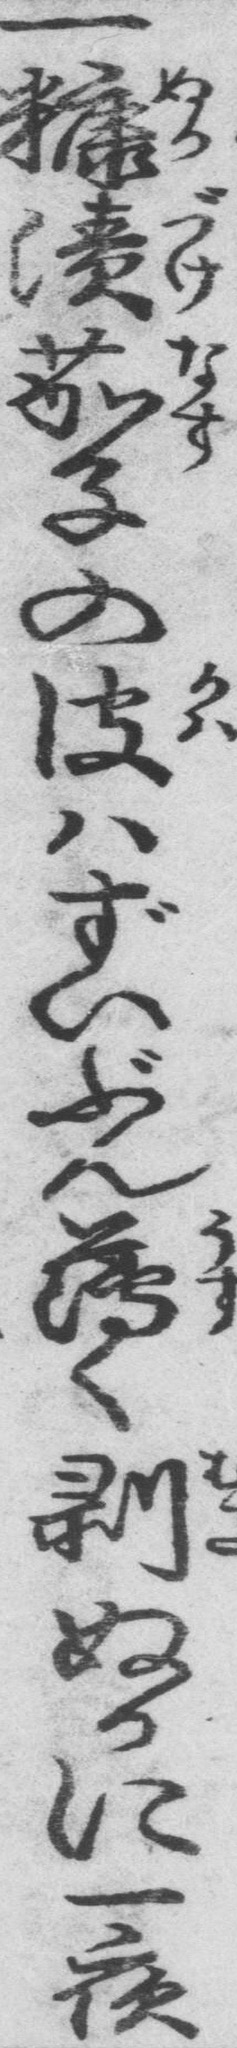一糠漬茄子の皮はずいぶん薄く剥ぬかに一夜
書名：料理伊呂波庖丁
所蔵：大阪府立大学学術情報センター 国文学研究資料館
